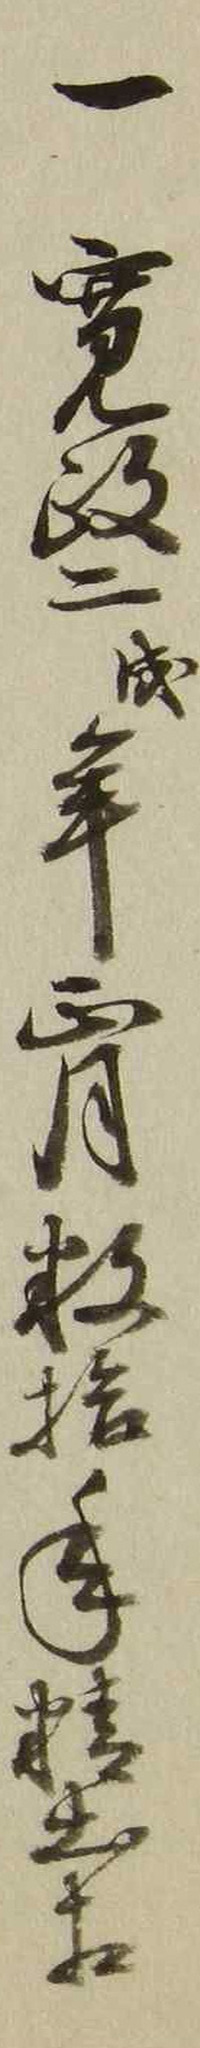一寛政二戌年正月数拾年精出相
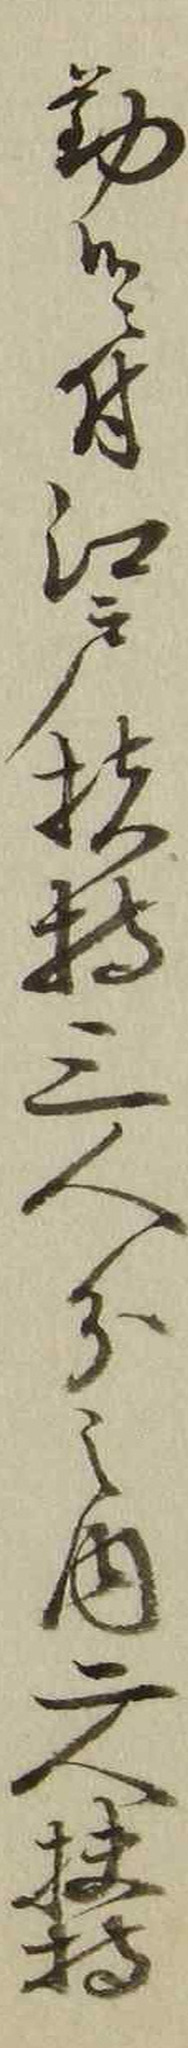勤候ニ付江戸扶持三人分之内二人扶持
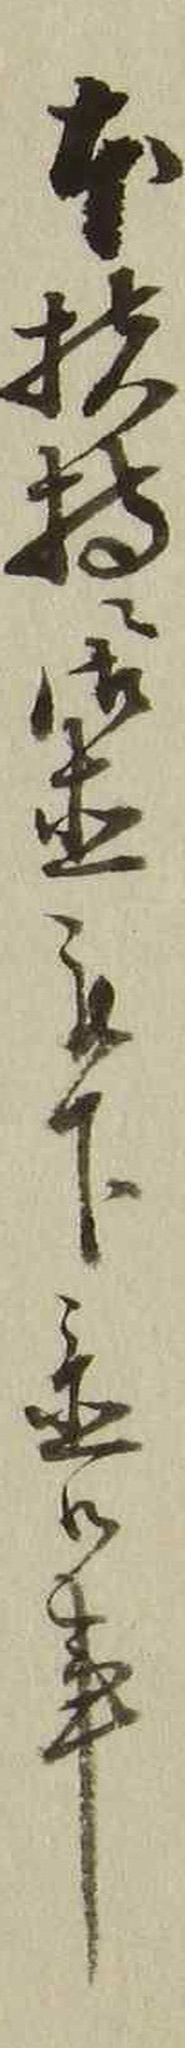本扶持ニ御直被下置候事
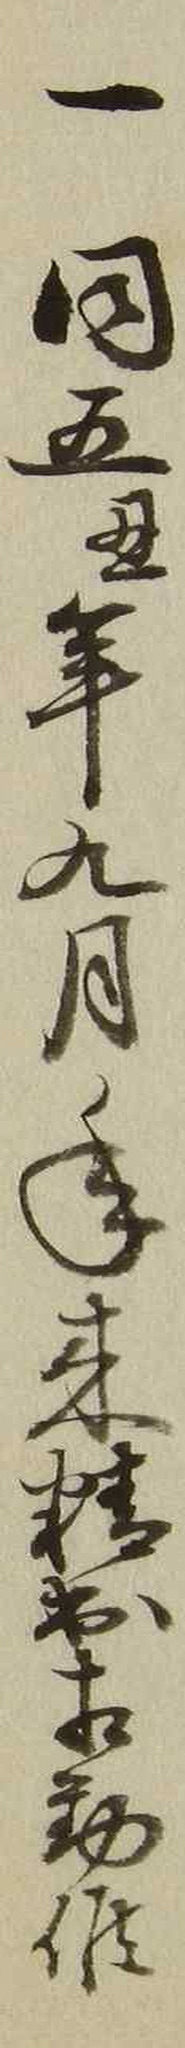一同五丑年九月年来精出相勤候
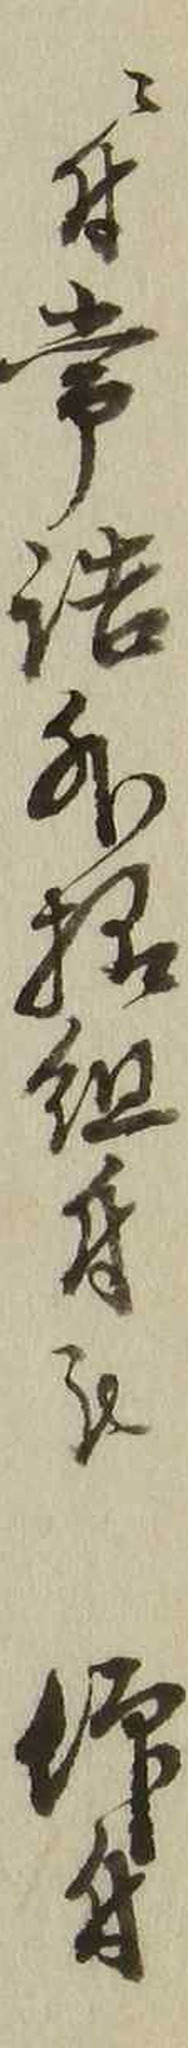ニ付常詰外様組付被仰付
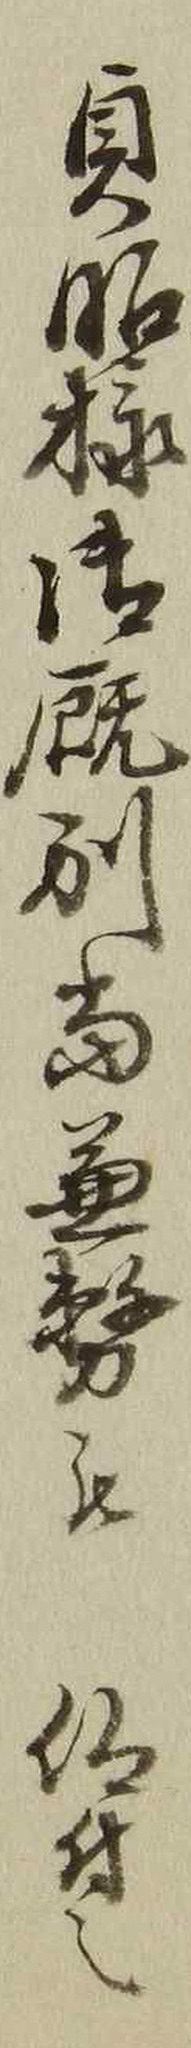貞昭院様御厩別当兼務被仰付之
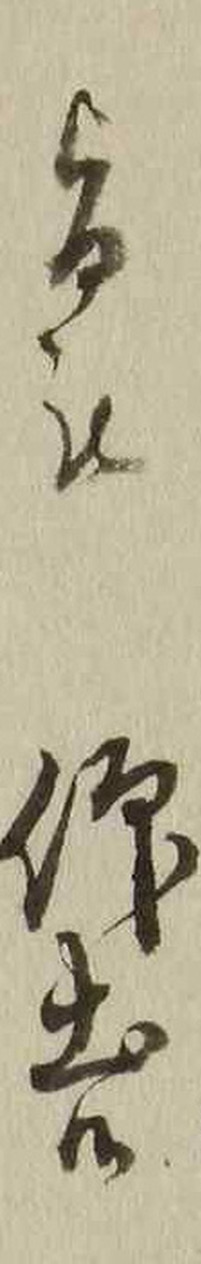旨被仰出候
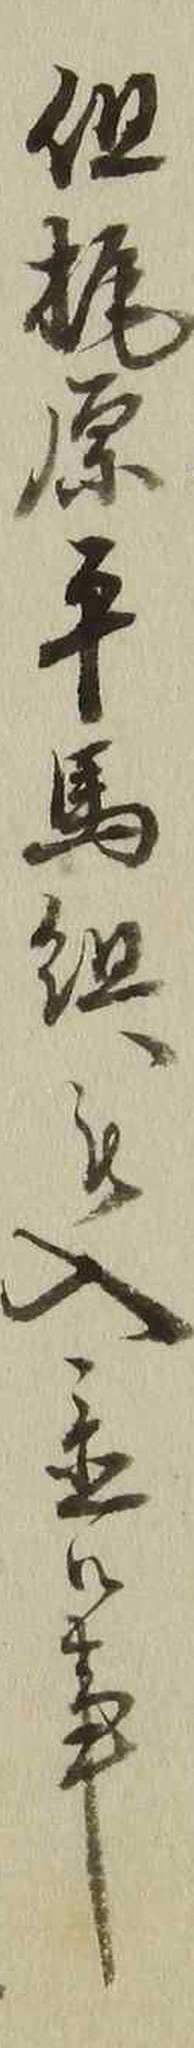但梶原平馬組へ被入置候事
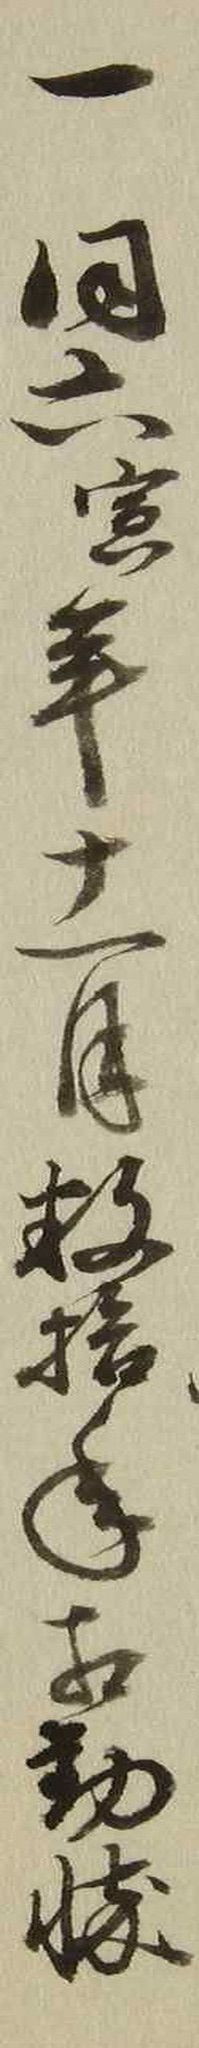一同六寅年十一月数拾年相勤忰
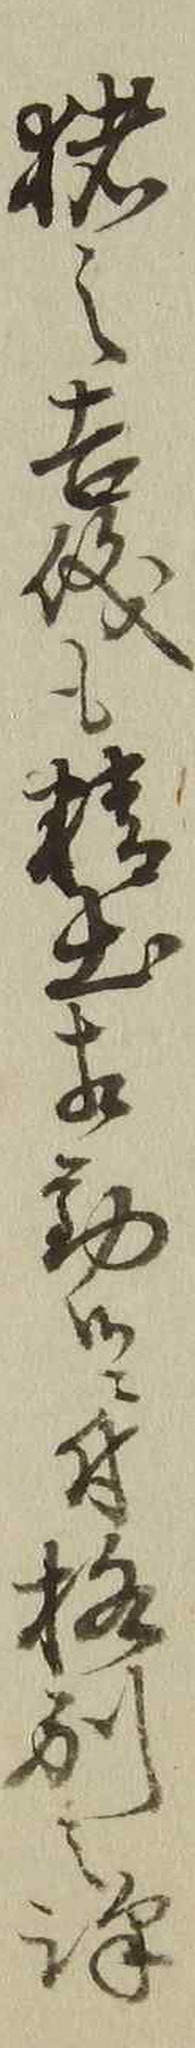猪之吉儀も精出相勤候ニ付格別之訳
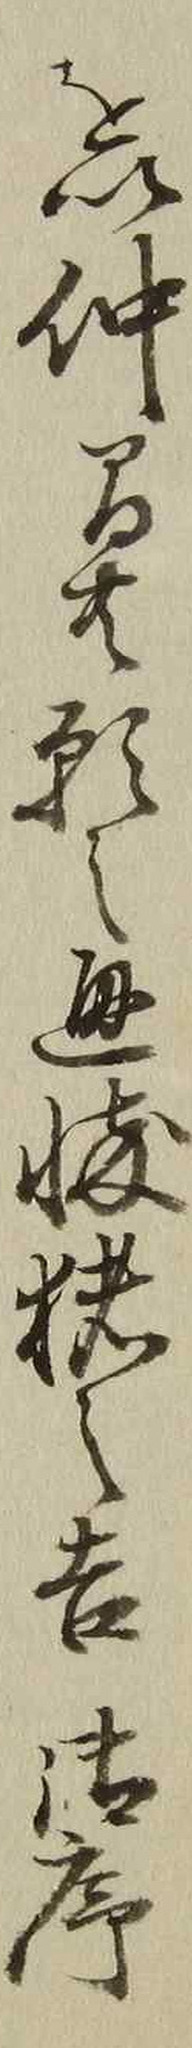を以仲間共願之通忰猪之吉御序
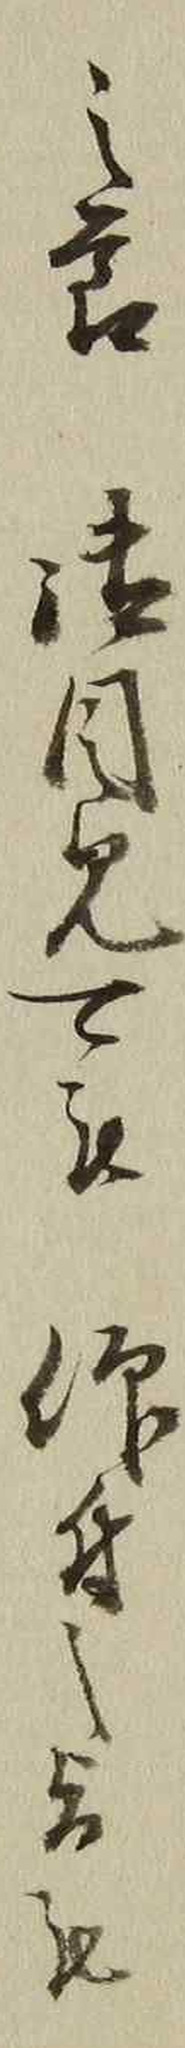之節御目見可被仰付之旨被
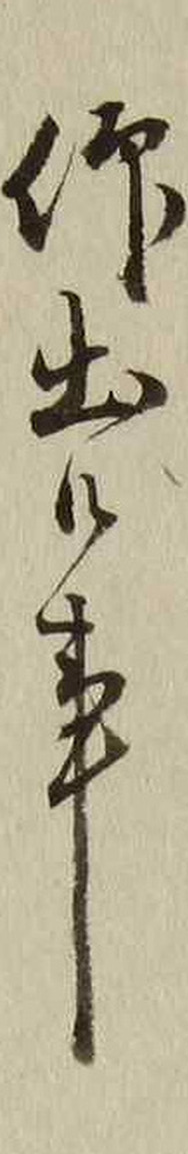仰出候事
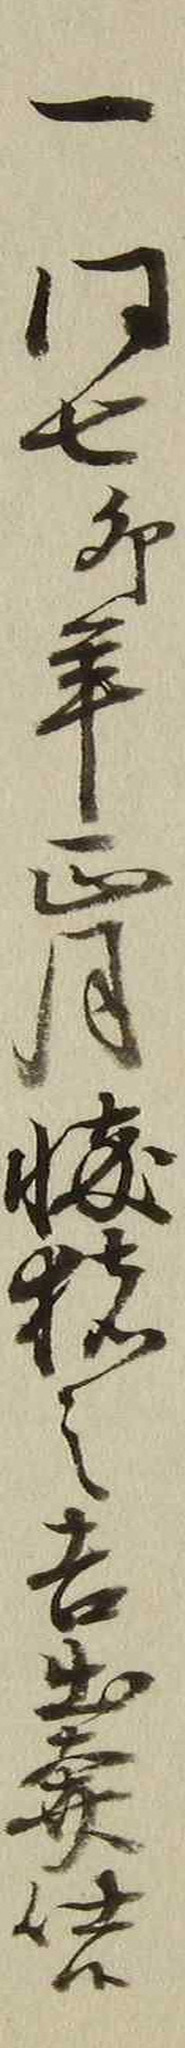一同七卯年正月忰猪之吉出奔仕候
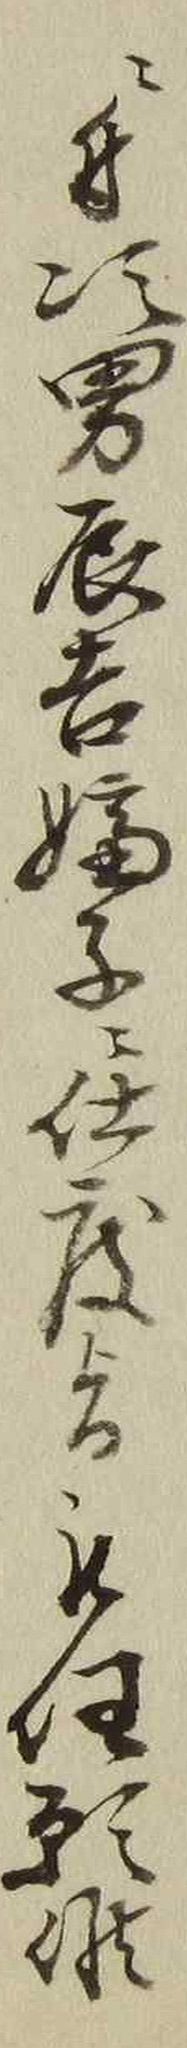ニ付次男辰吉嫡子ニ仕度旨被任願候
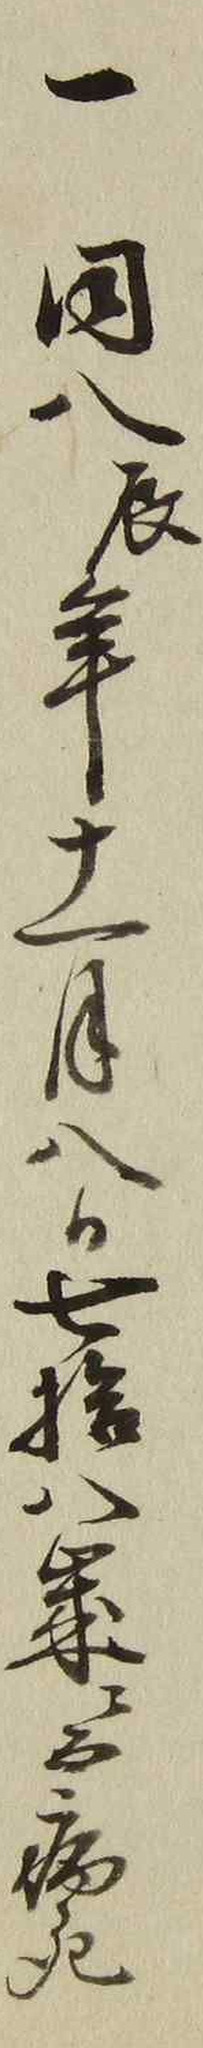一同八辰年十一月八日七拾八歳ニ而病死
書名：諸士系譜　巻之31　い之部31
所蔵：会津若松市立会津図書館
